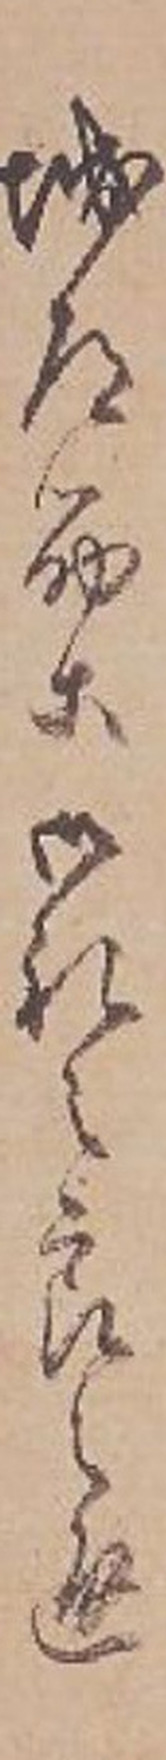城道筋等御礼之節之通

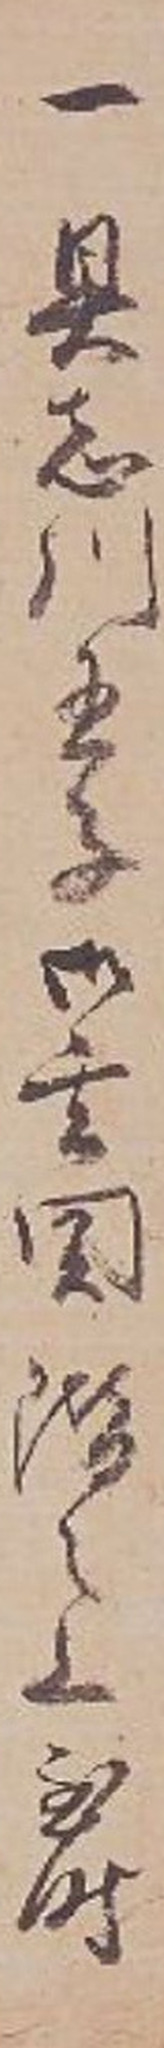一具志川王子御玄関階之上至時
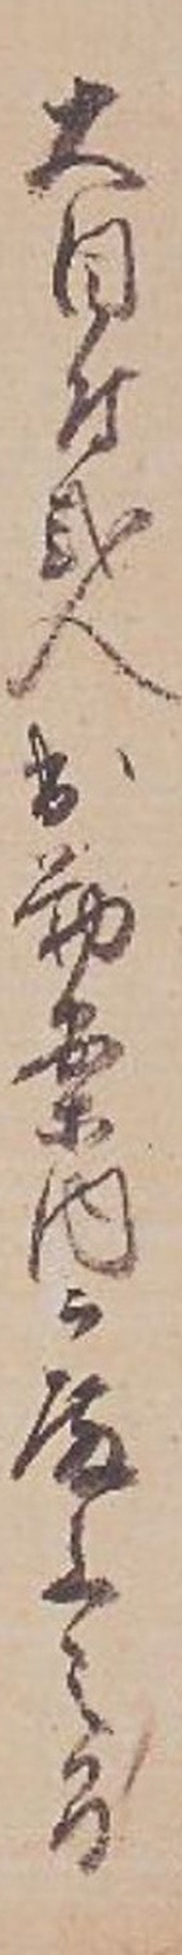大目付弐人出勤案内而殿上之間
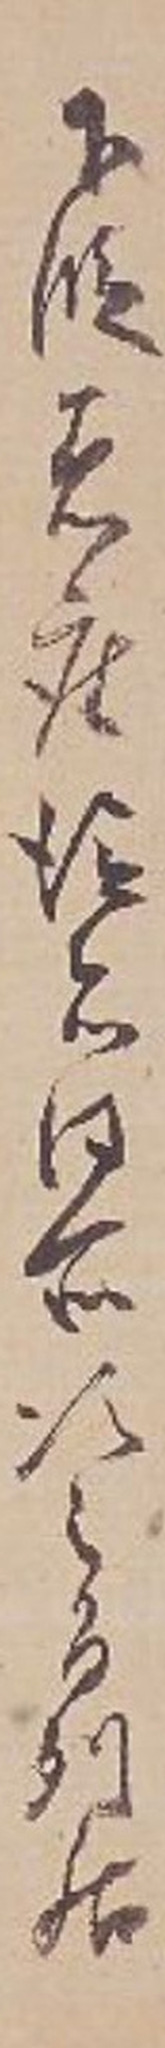下段着座従者同所次之間列居
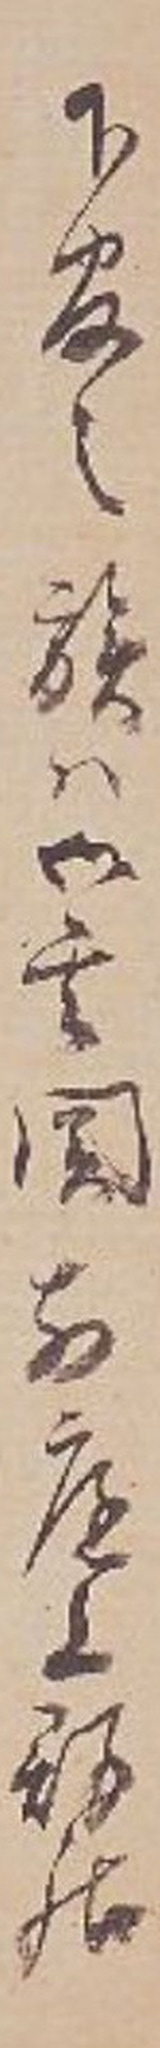下官之族は御玄関前庭上郡居
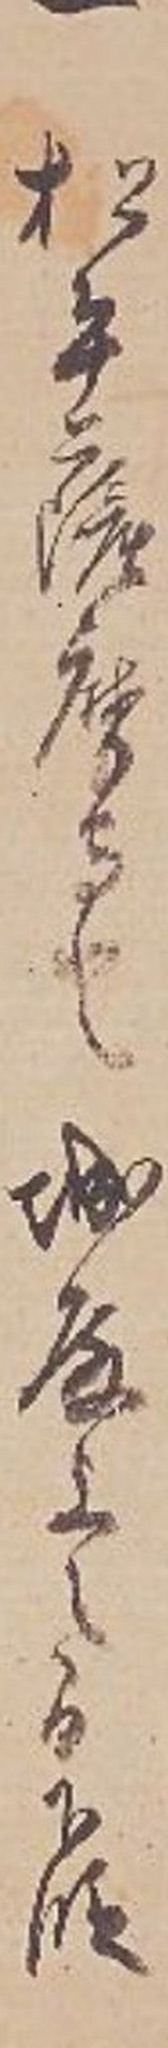一松平薩摩守登城殿上之間下段
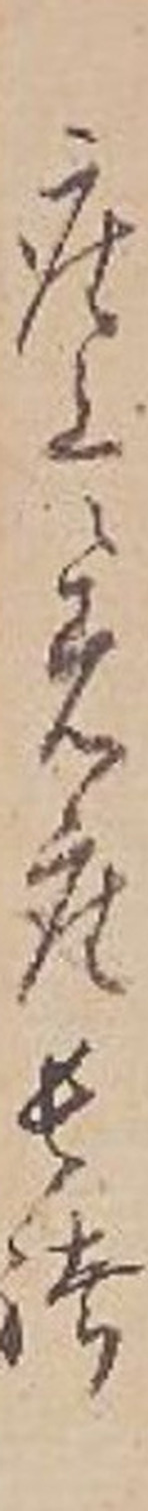座上に着座長袴
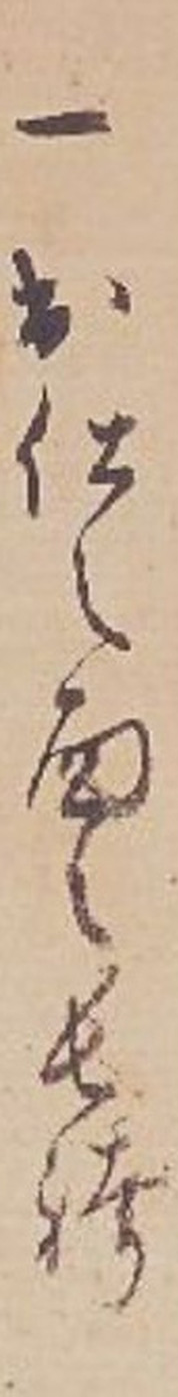一出仕之面々長袴
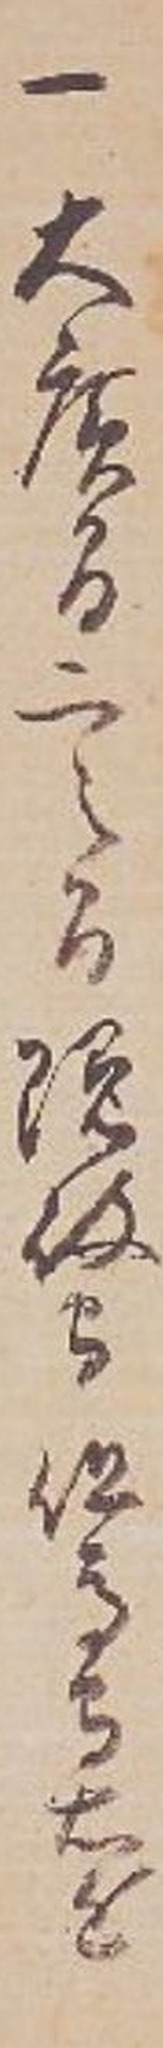一大広間二之間隠岐守但馬守右近
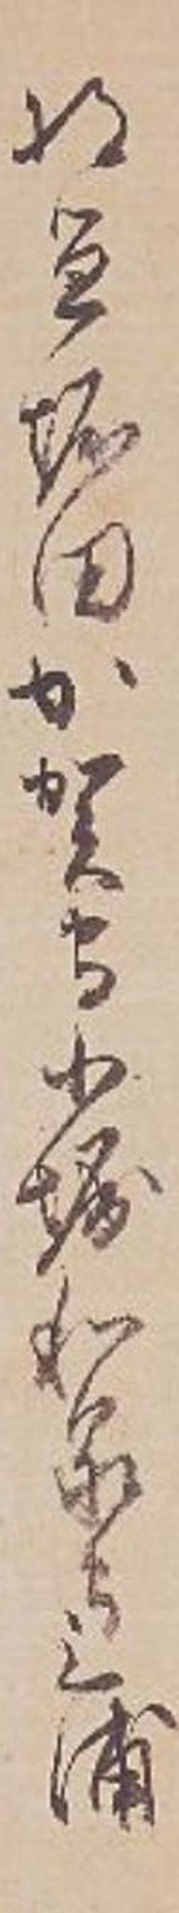将監堀田加賀守小堀和泉守三浦
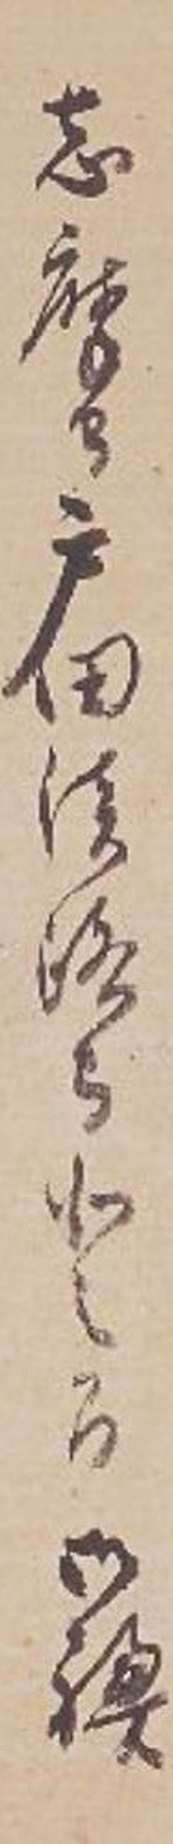志摩守戸田淡路守北之間御襖
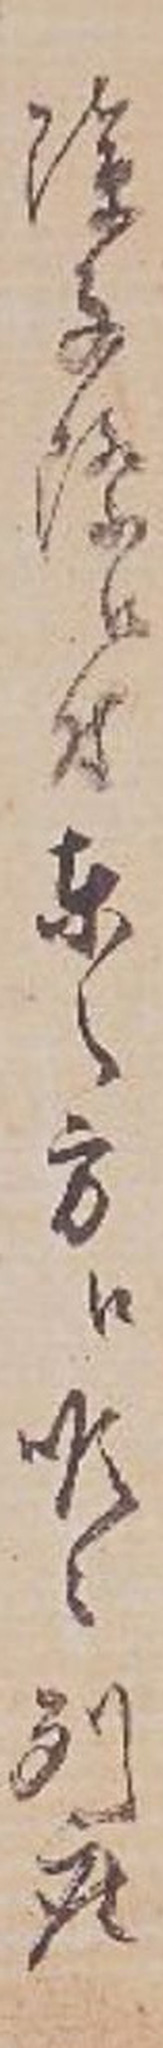障子際え付東之方え順々列座
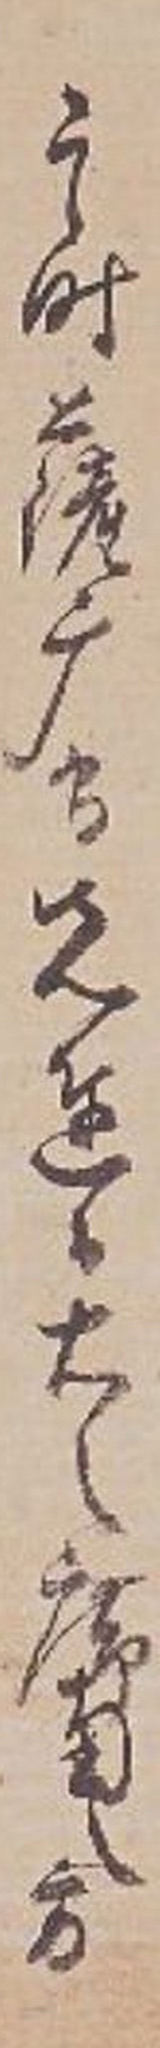于時薩摩守先達而右之席南之方

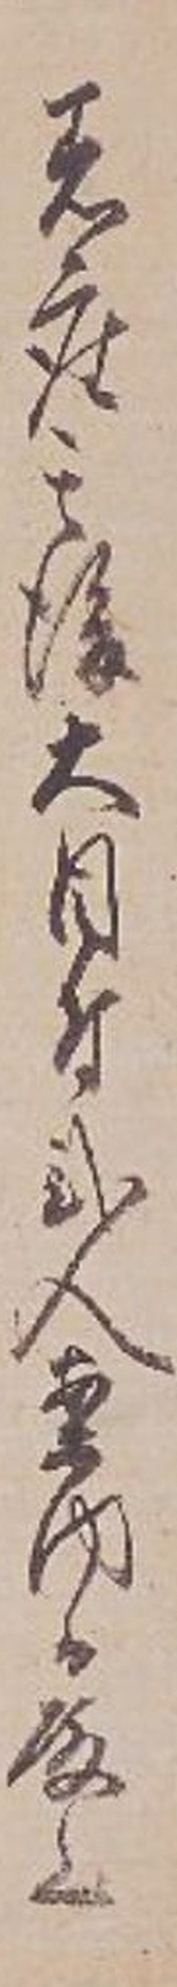着座其後大目付弐人案内而殿上
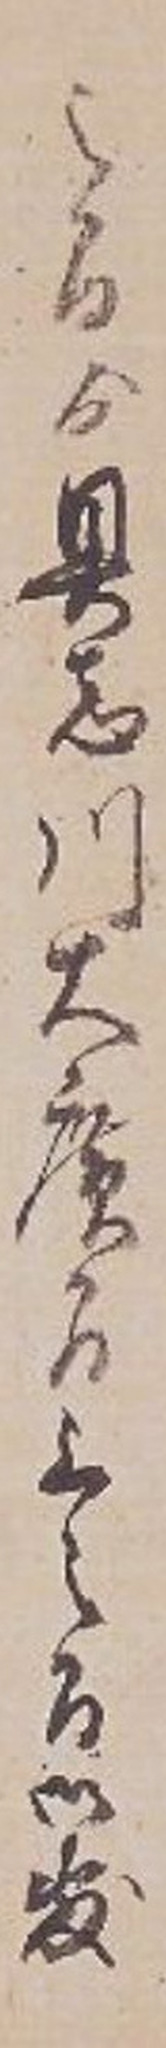之間ゟ具志川大広間三之間御敷
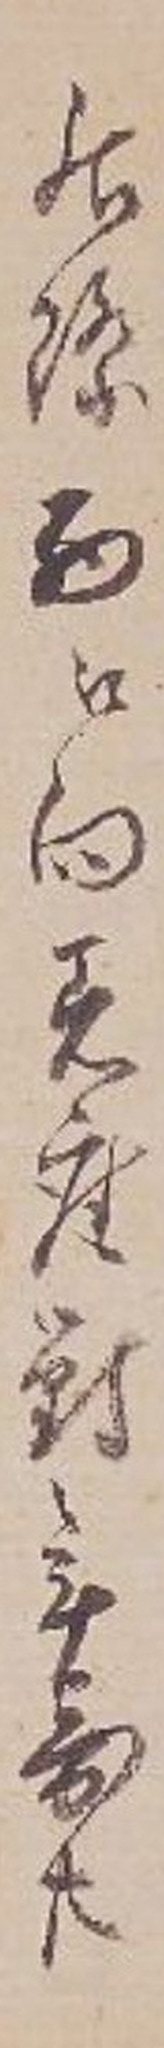居際西え向着座対年寄共
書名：琉球人来朝記 八、九
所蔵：University of the Ryukyus Library
